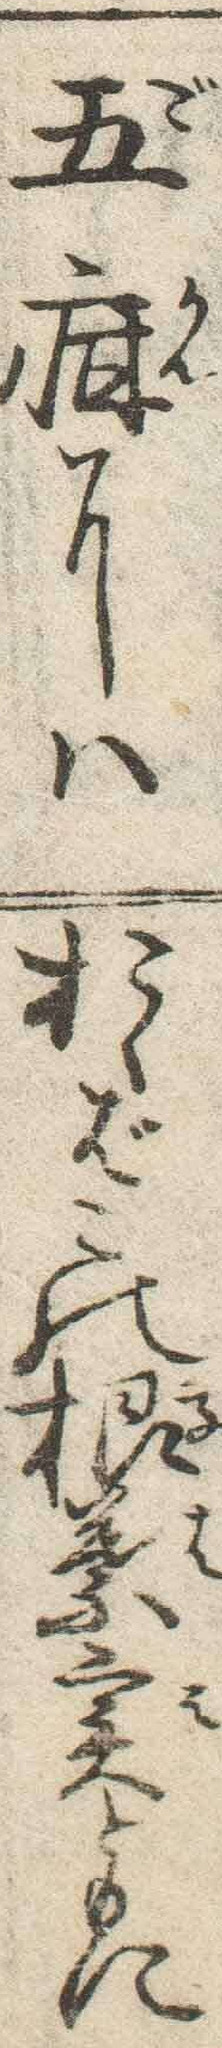五疳にはおゝばこの根葉実ともに
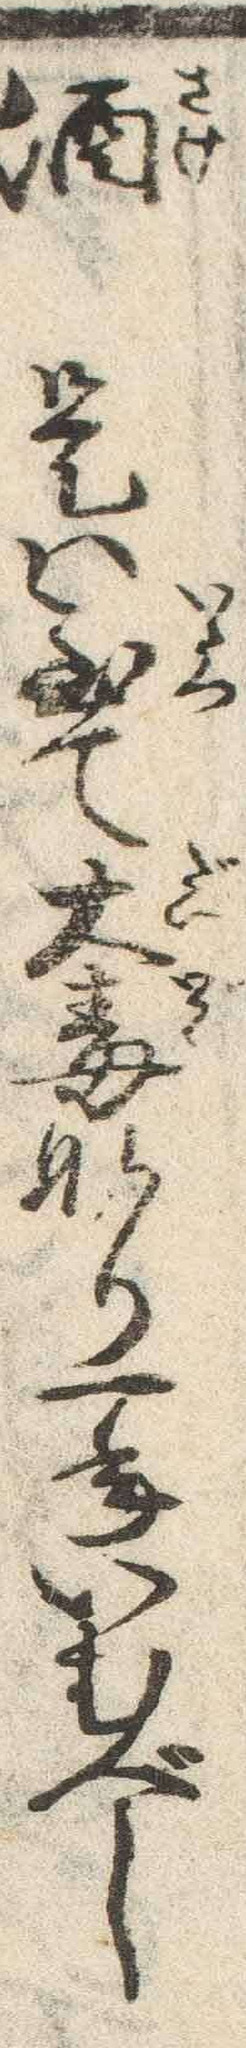酒是は至て大毒なり一年いむべし
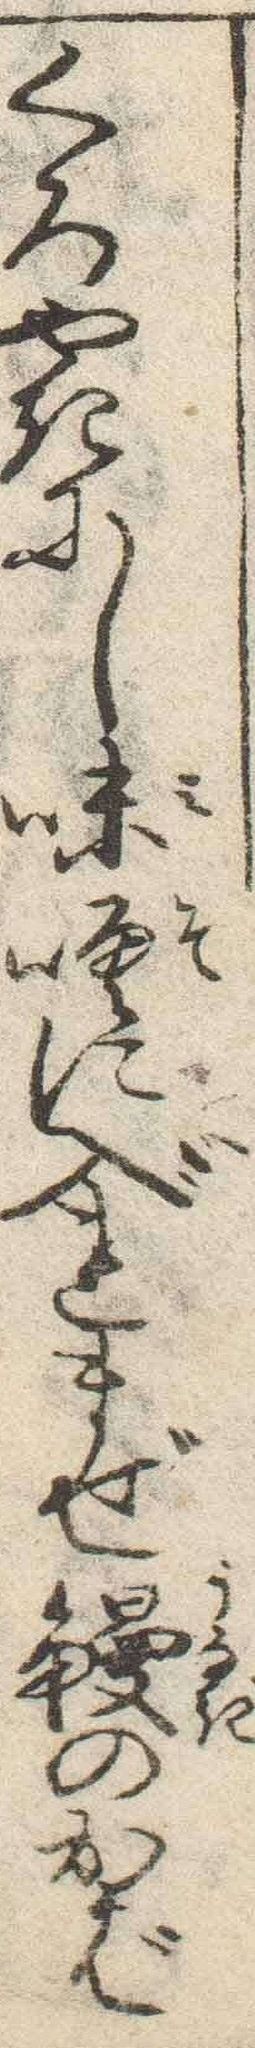くろやきにし味噌に入れまぜう鰻のかば
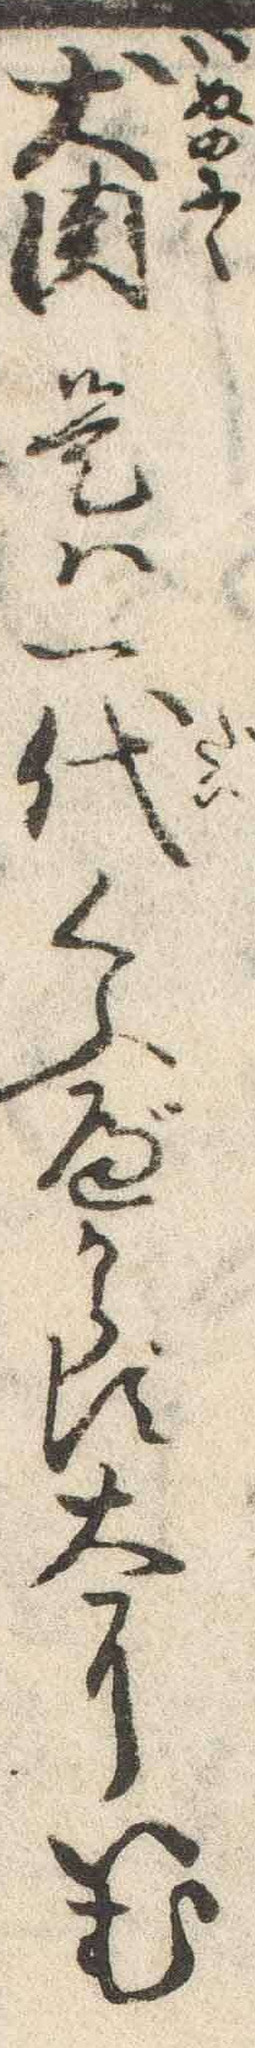犬肉是は一代くふべからず大にいむ
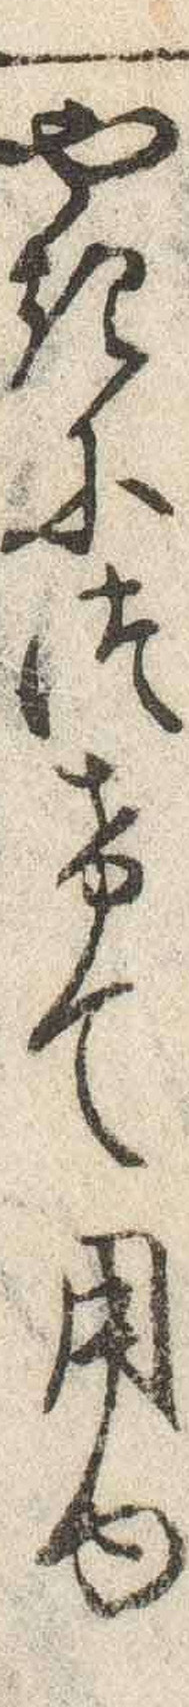やきにつけて用ゆ
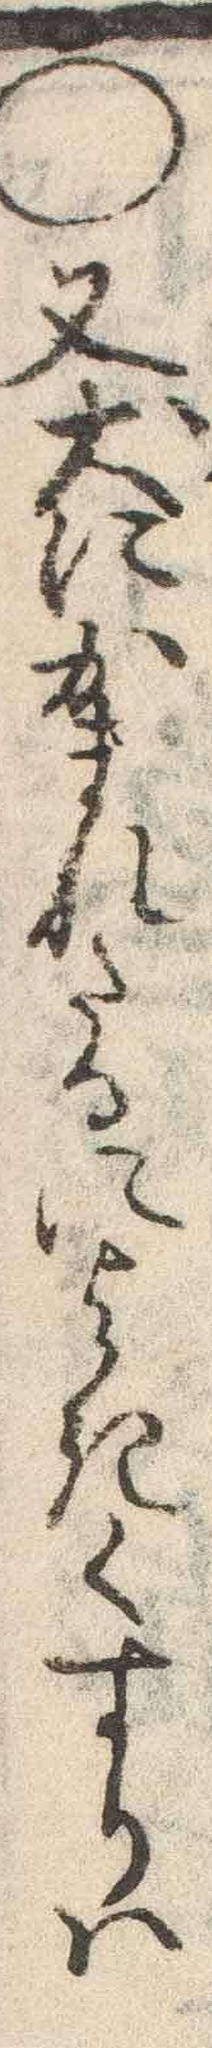〇又犬にかまれたるによきくすりは
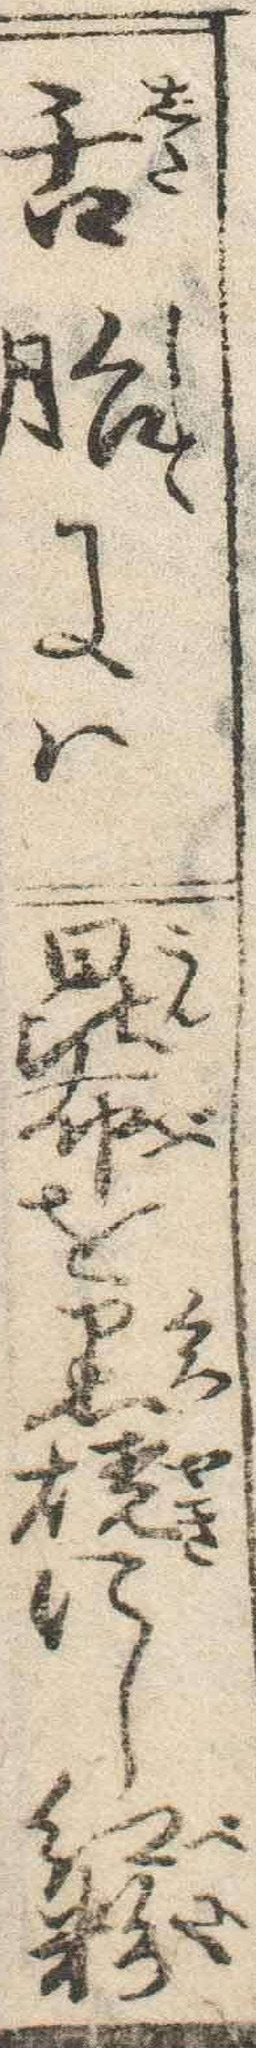舌胎には昆布を黒焼にし紅粉
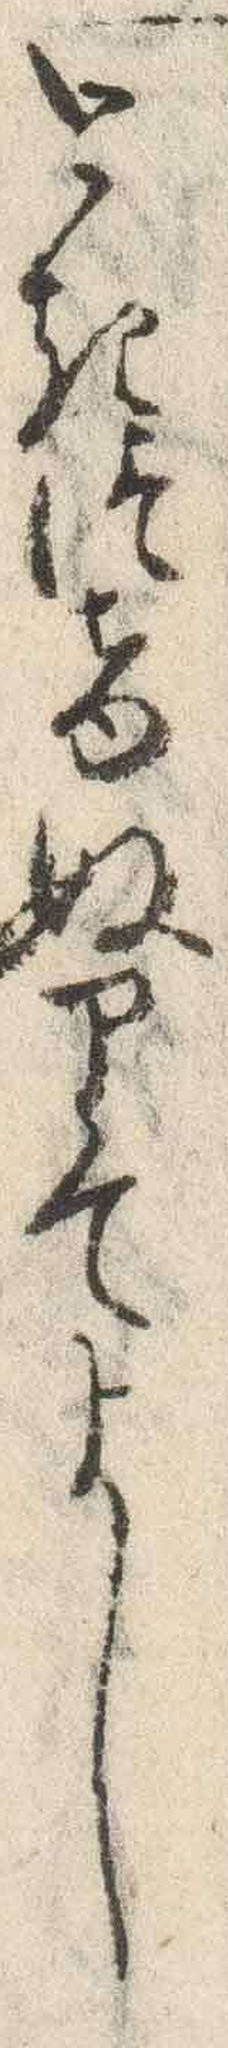ときつけぬりてよし
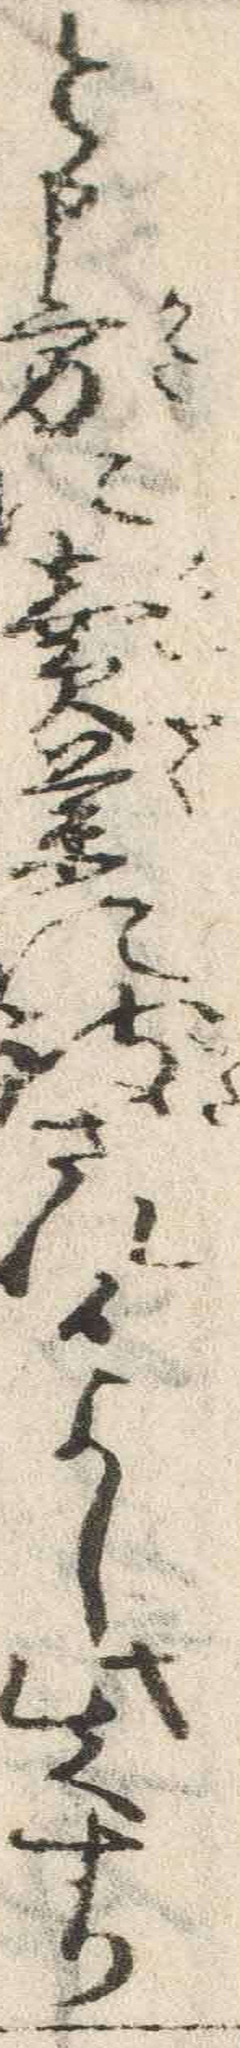と申方に売薬に致され候よし此くすり
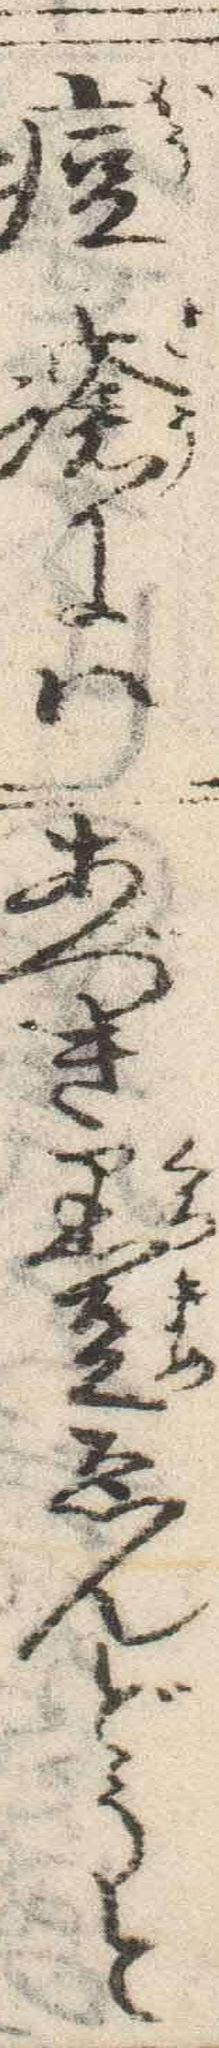疱瘡にはあづき黒豆ゑんどうと
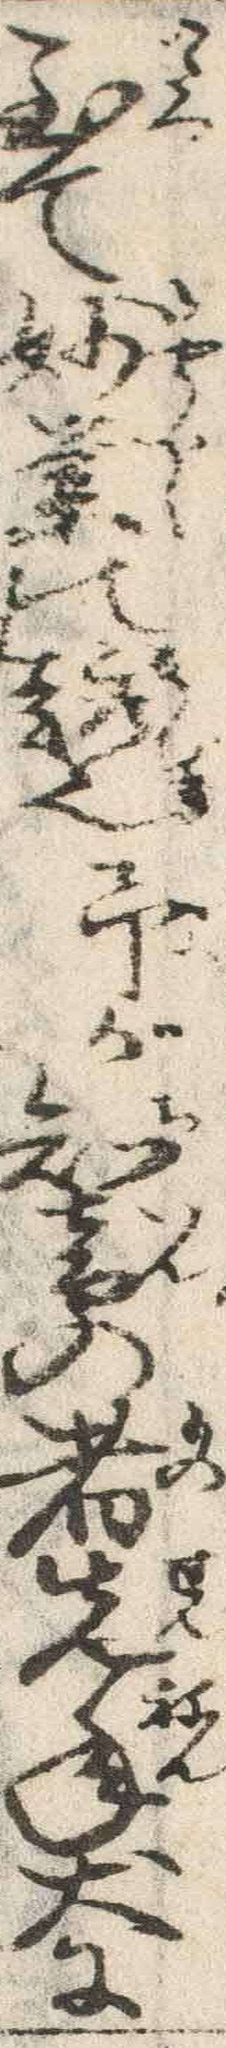至て妙薬の趣也予が知音の者先年犬に
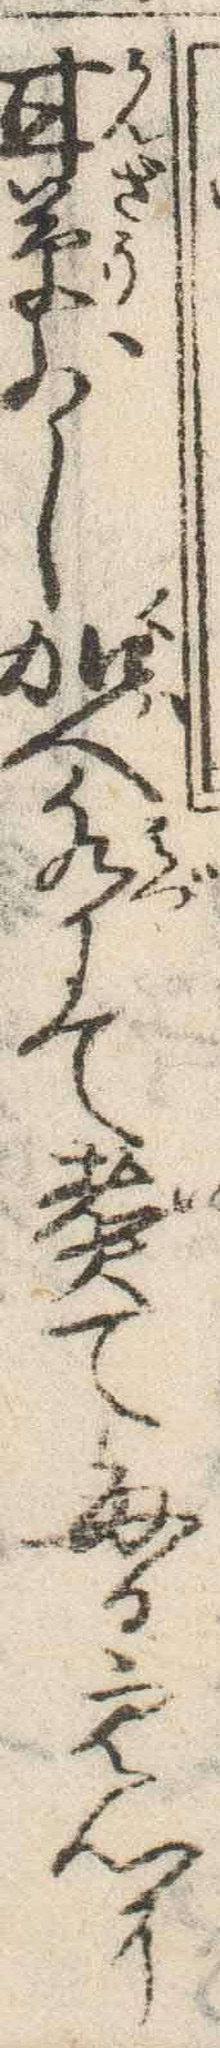甘草少し加へ水にて煮て毎日心に
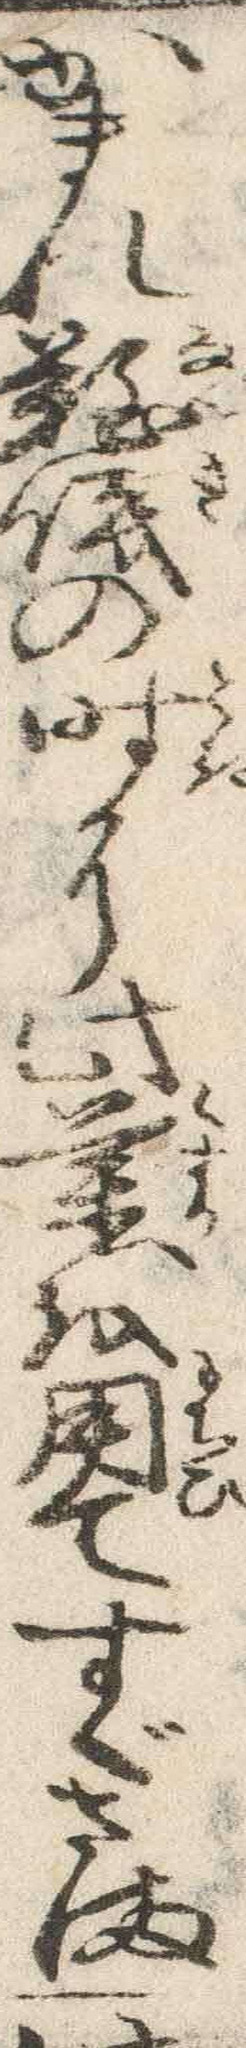かまれ難義の時に此薬を用てすぐさま
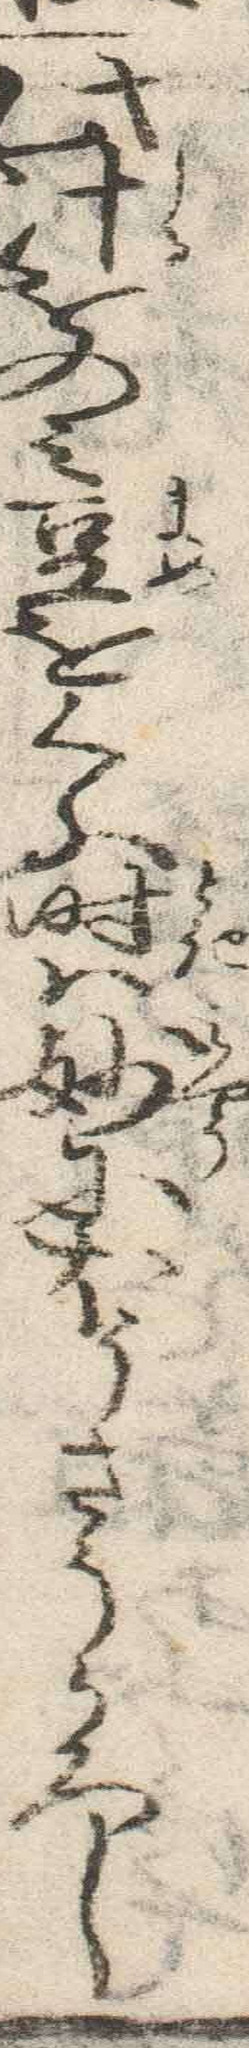此汁をのみ豆をくふ時は妙にほうさうかろし
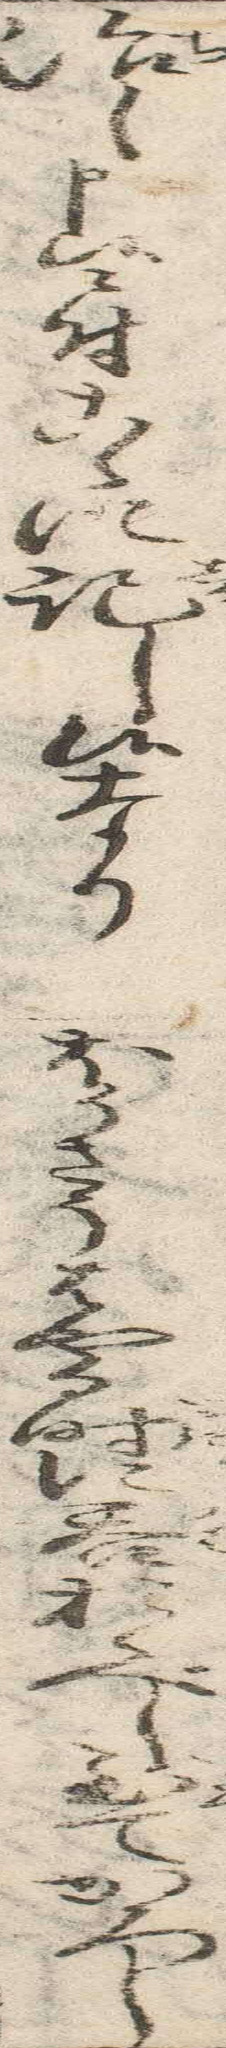治し申候に付こゝに記し候なり
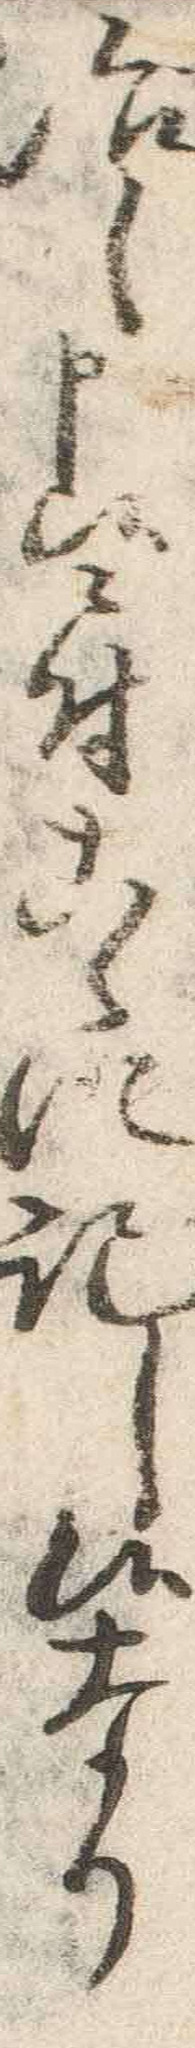治し申候に付こゝに記し候なり
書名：撫育草
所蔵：東京学芸大学附属図書館 国文学研究資料館
